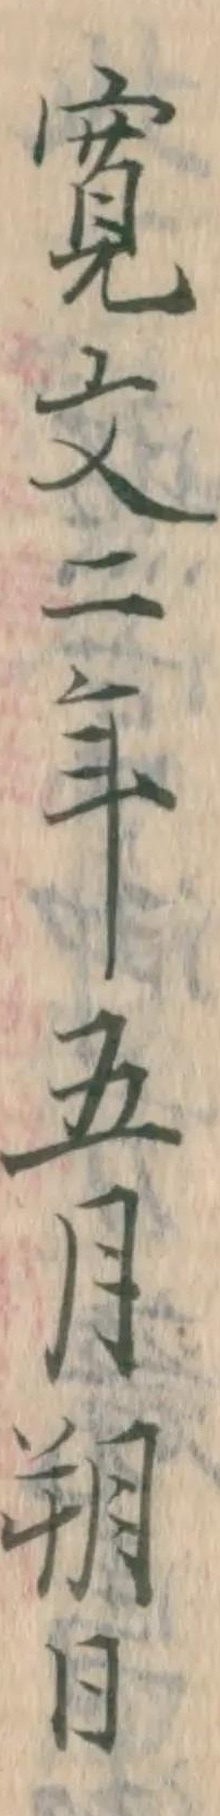寛文二年五月朔日
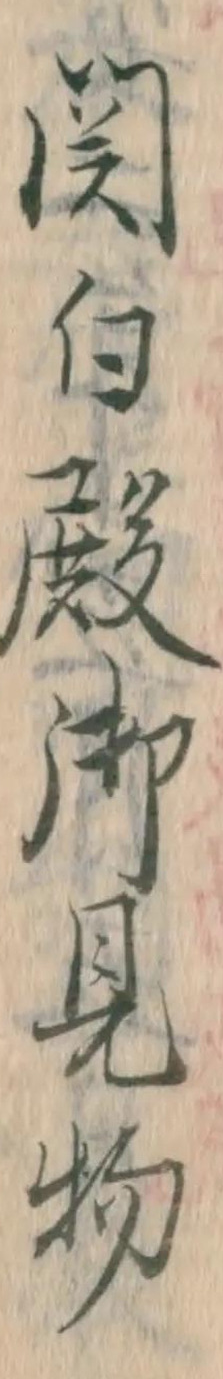関白殿御見物
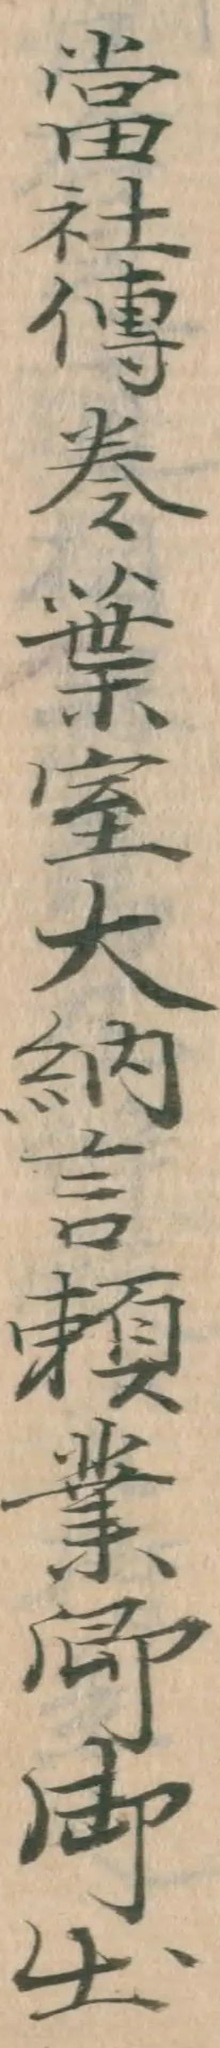当社伝奏葉室大納言頼業卿御出
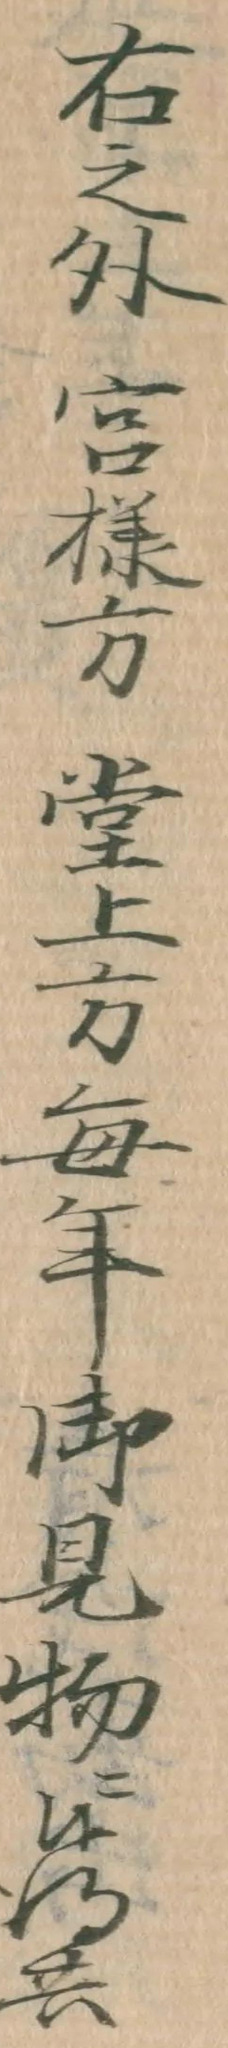右之外宮様方堂上方毎年御見物ニ候得共
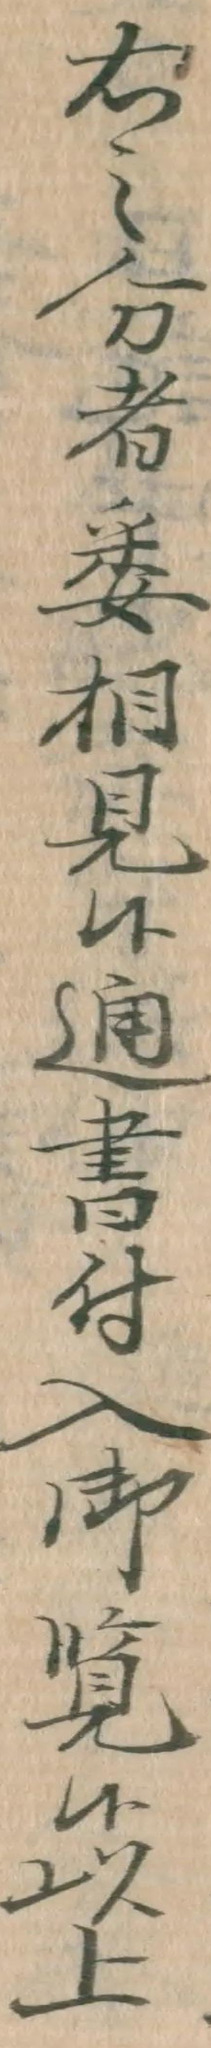右之分者悉相見候通書付入御覧候以上
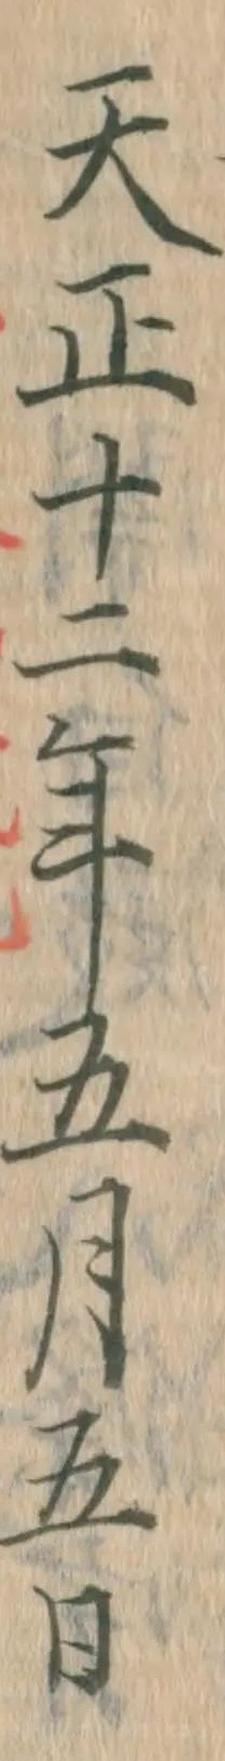天正十二年五月五日
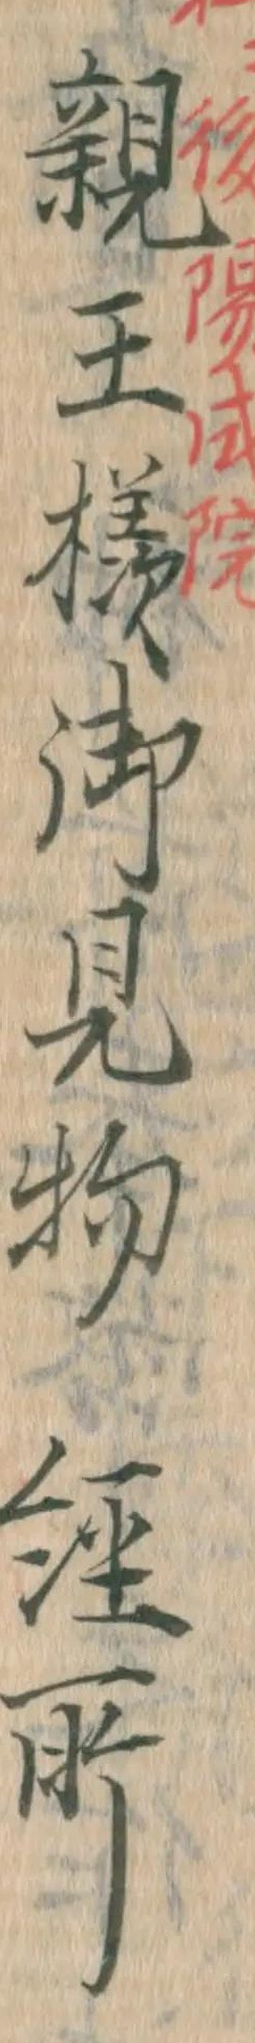親王様御見物経所
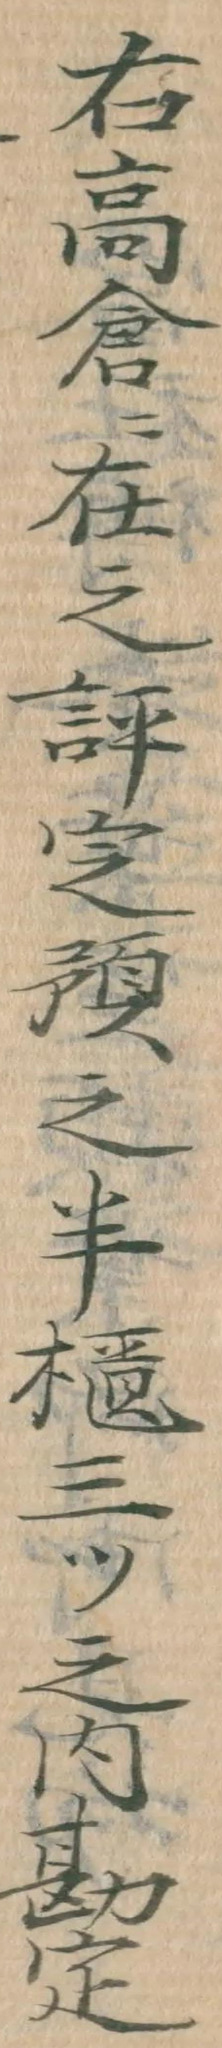右高倉ニ在之評定預之半櫃三ツ之内勘定
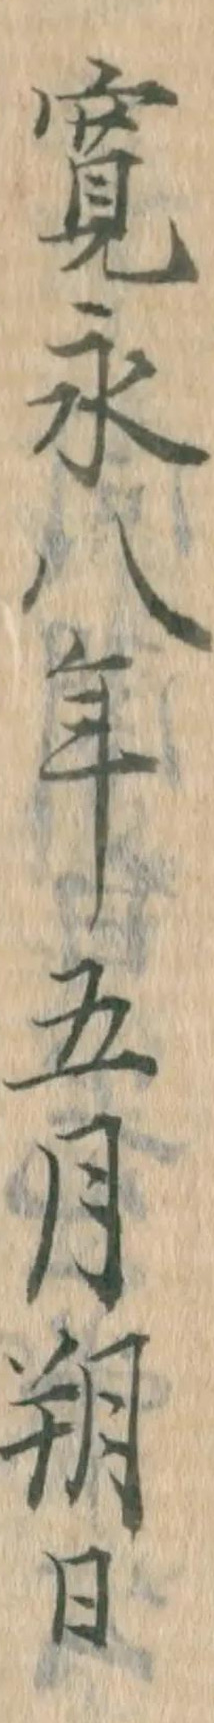寛永八年五月朔日
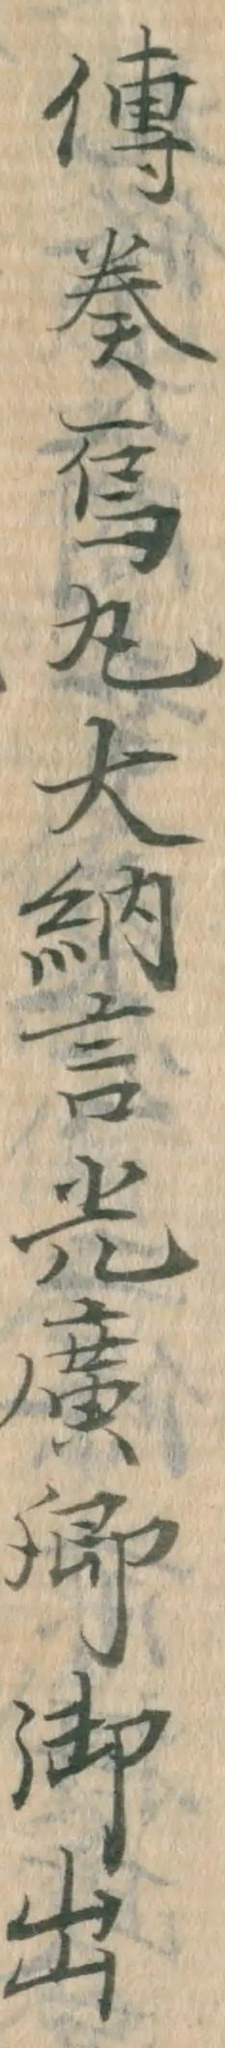伝奏焉丸大納言光廣卿御出

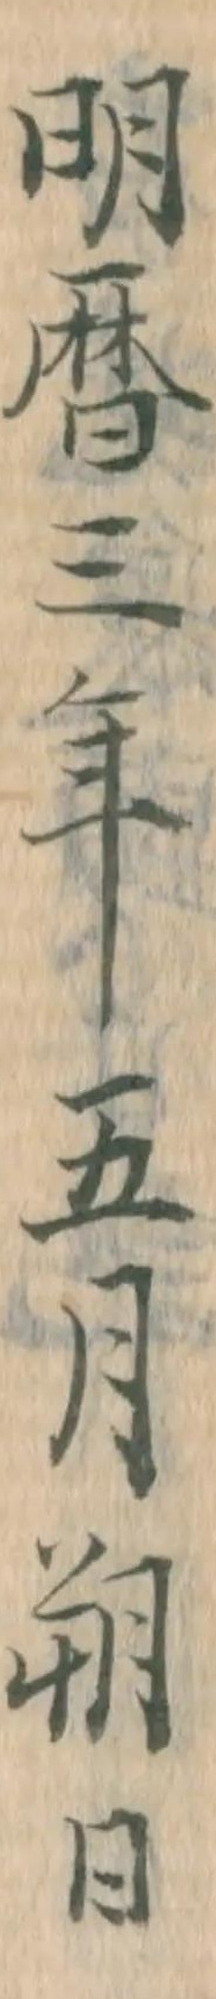明暦三年五月朔日
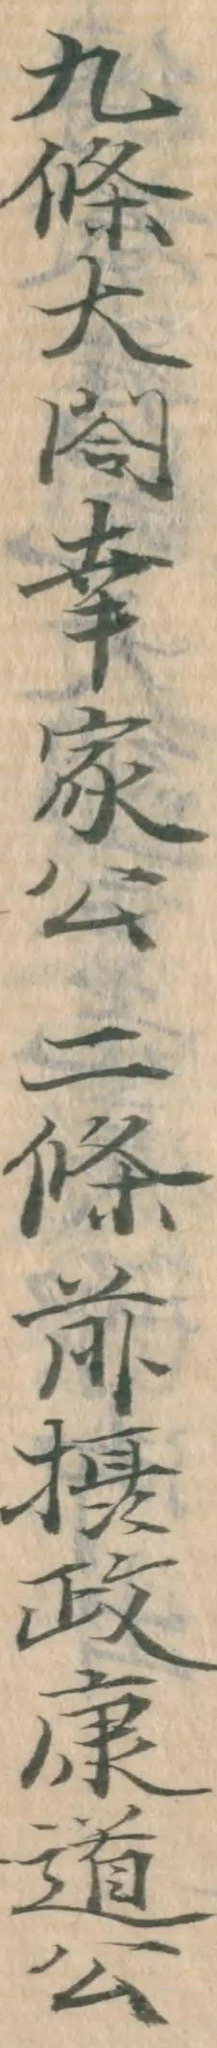九条大閤幸家公二条前摂政康道公
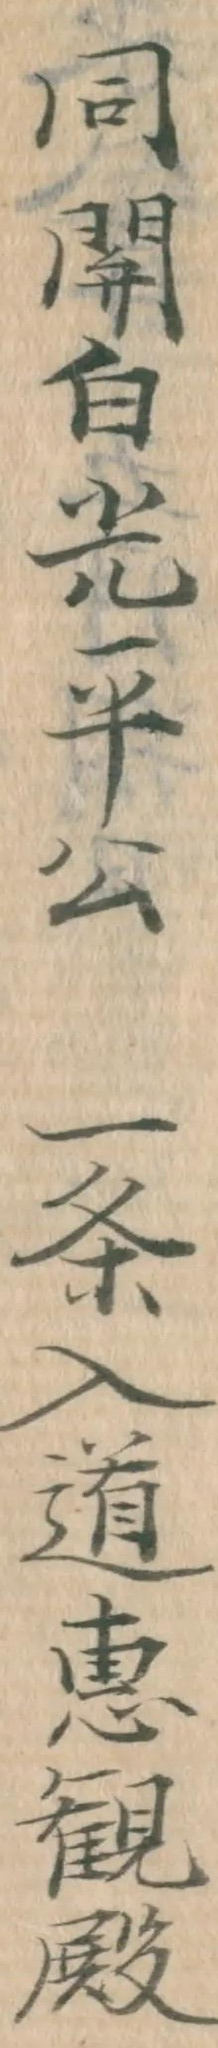同関白光平公一条入道恵観殿
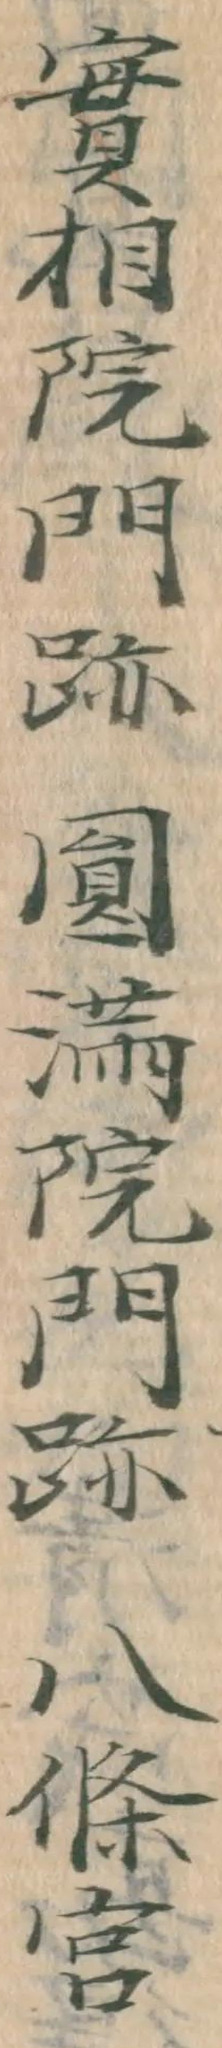実相院門跡円満院門跡八条宮
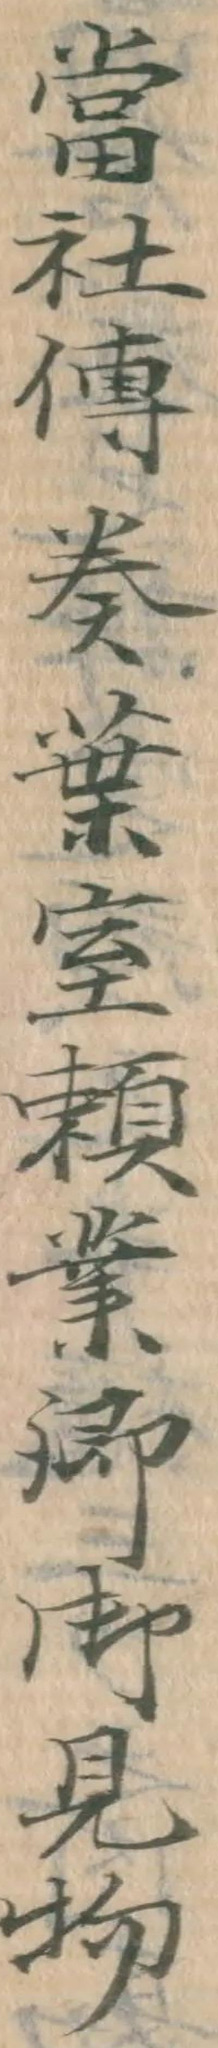当社伝奏葉室頼業卿御見物
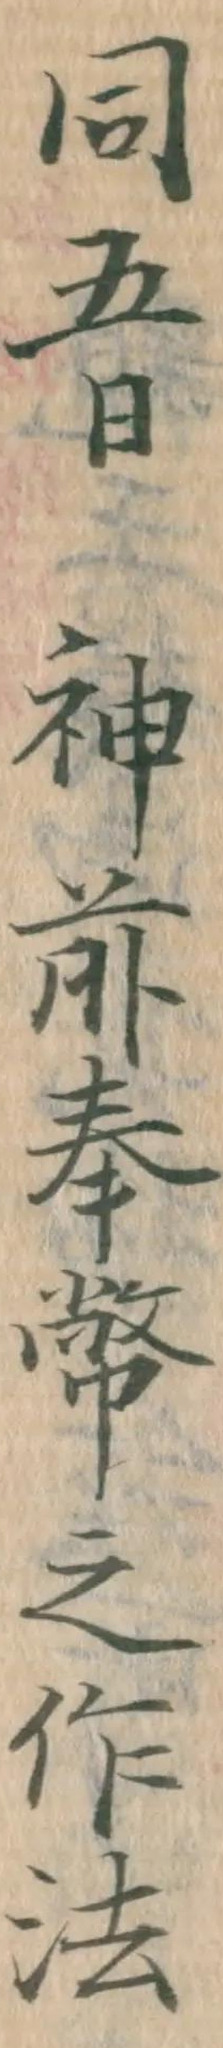同五日神前奉幣之作法
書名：賀茂社記録. 第10冊
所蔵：国立国会図書館 National Diet Library, JAPAN
